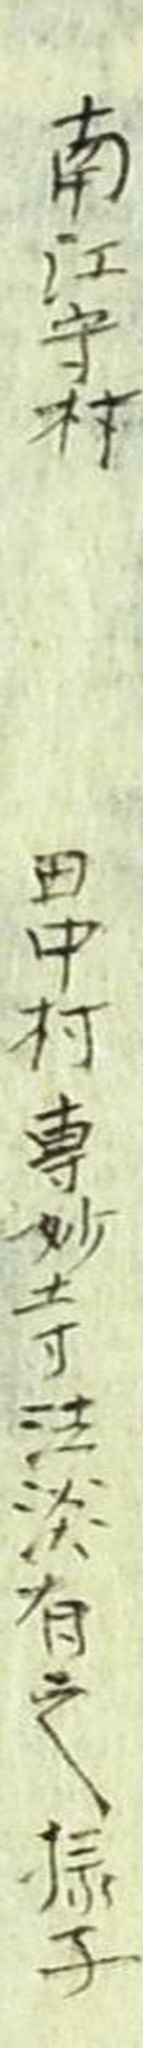南江守村田中村専妙寺法談有之様子
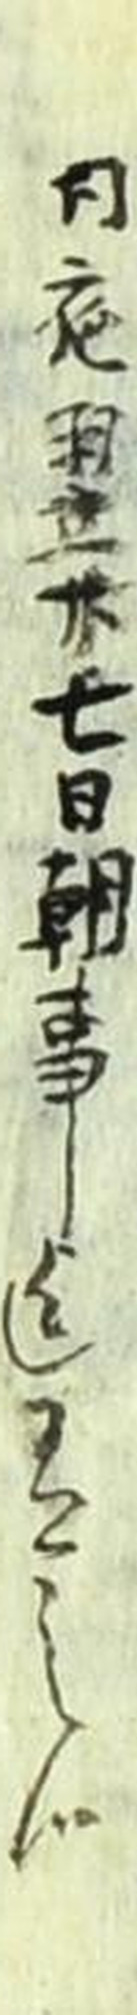同夜翌廿七日朝事迄有之候
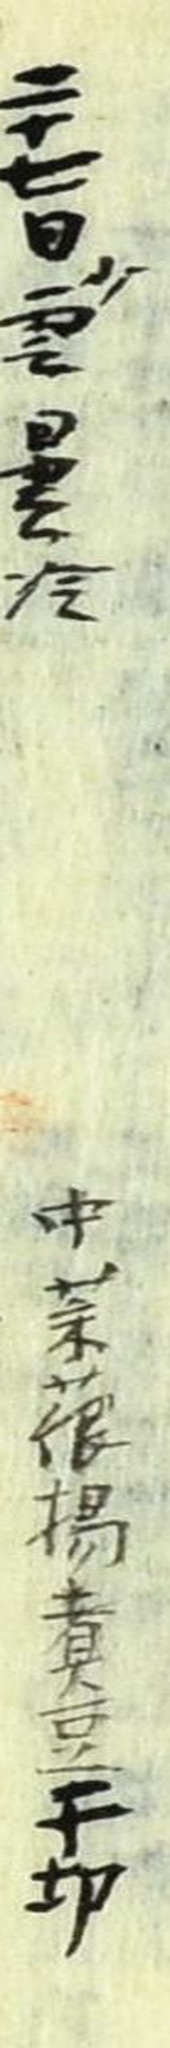○二十七日少雲曇冷中菜菔揚煮豆干切
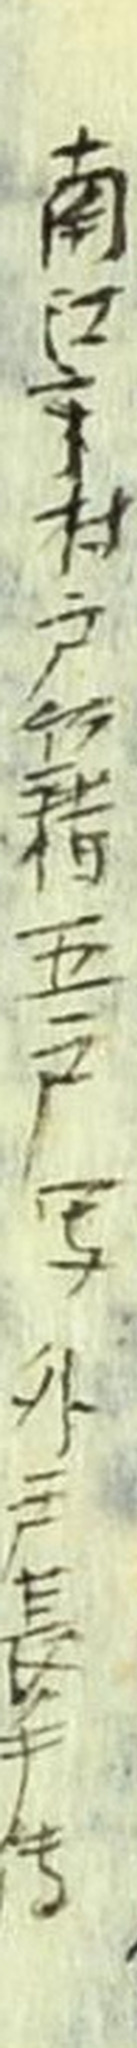南江守村戸籍五戸写外戸長手伝
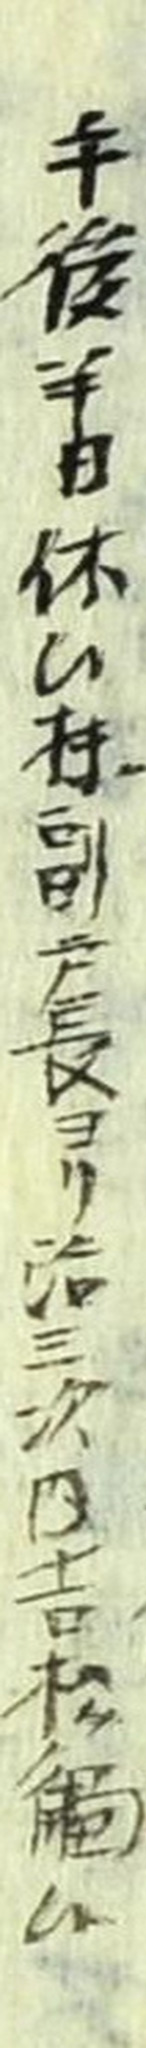午後半日休候様副戸長ヨリ治三次内吉松触候
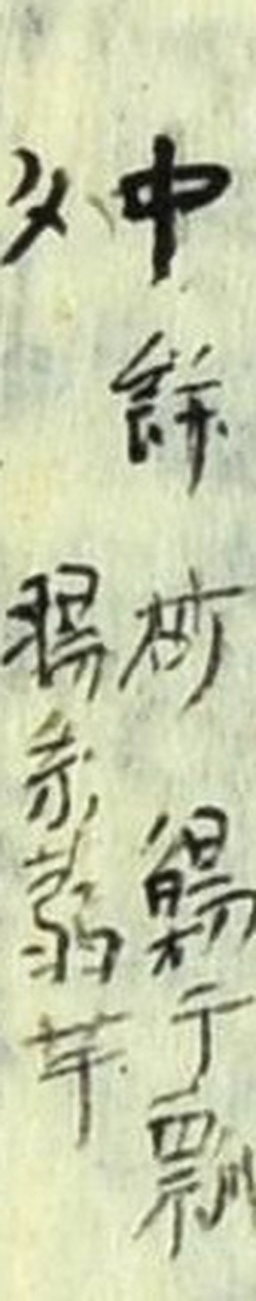夕揚糸蒻芋
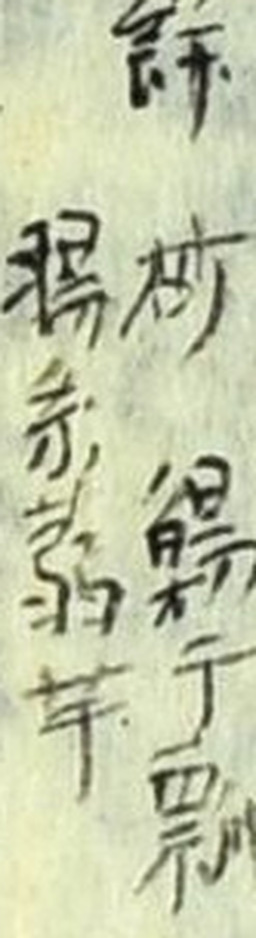夕揚糸蒻芋
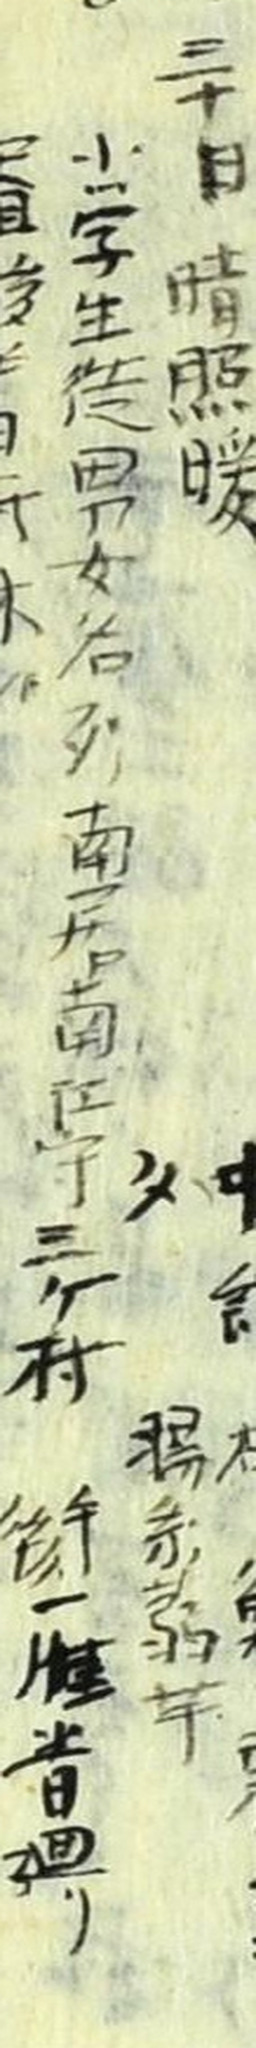小学生徒男女名列南居南江守三ヶ村午後雁番廻リ
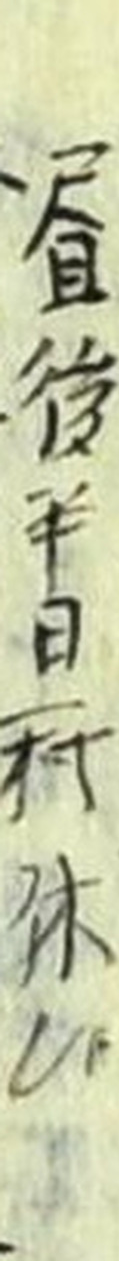昼後半日一村休ム
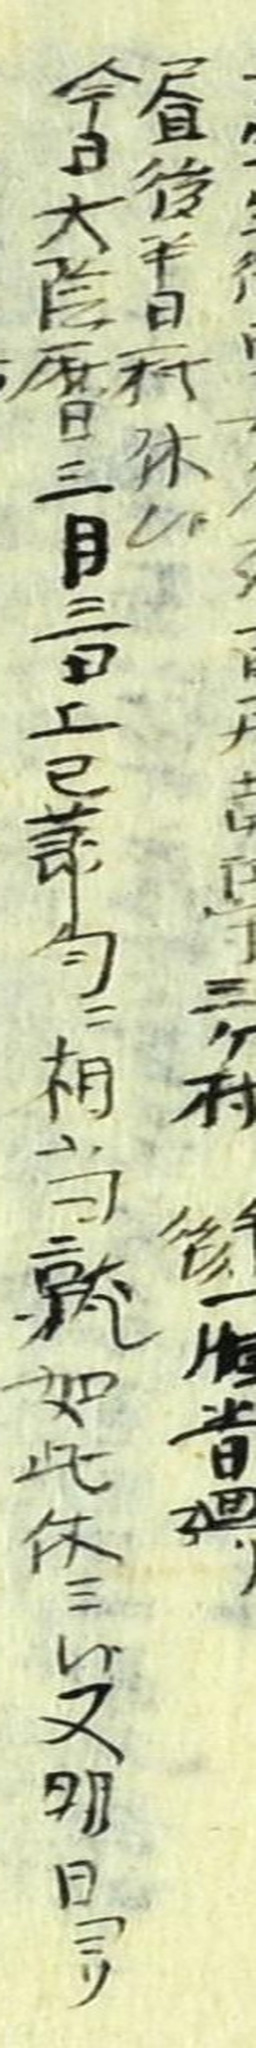今日大陰暦三月三日上巳節句ニ相当就如此休ミ候又明日ヨリ
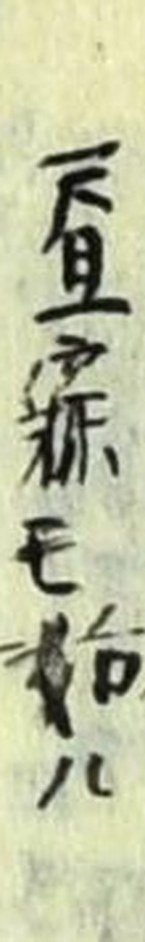昼寝モ始ル
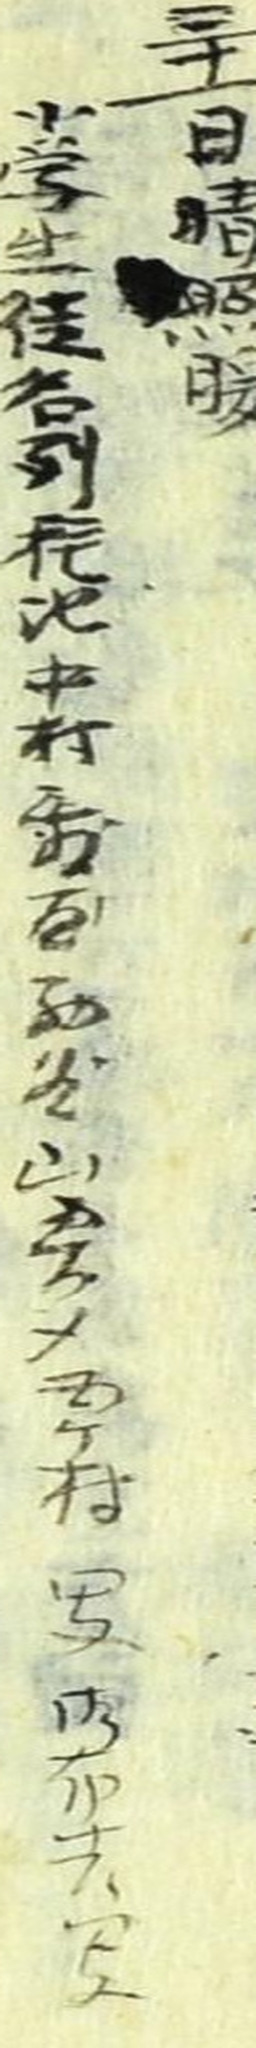小学生徒名列種池中村舞屋西谷山奥〆五ヶ村写御布告写
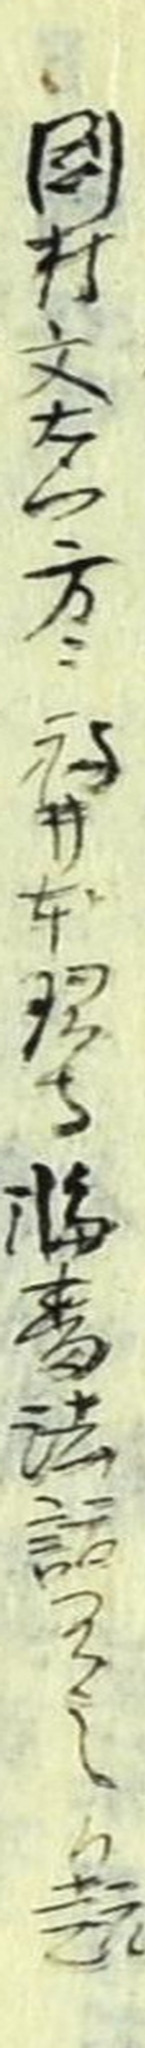淵村文右衛門方ニ福井本瑞寺輪番法話有之候趣
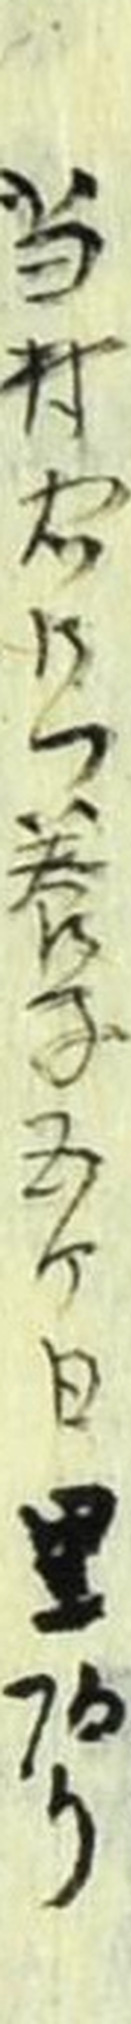当村忠左衛門養子五ヶ日里帰り
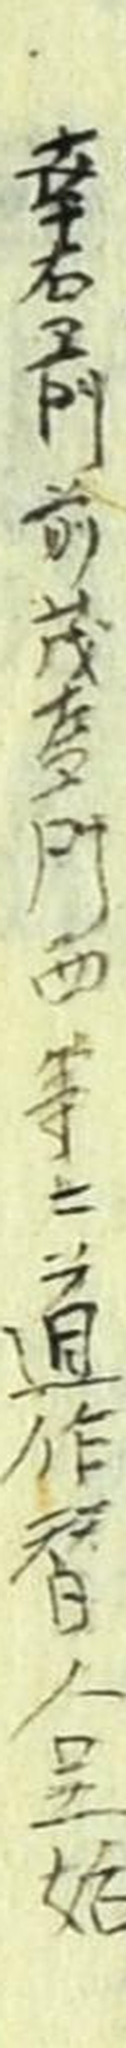幸右衛門前茂左ヱ門西等ニ道作替人足始

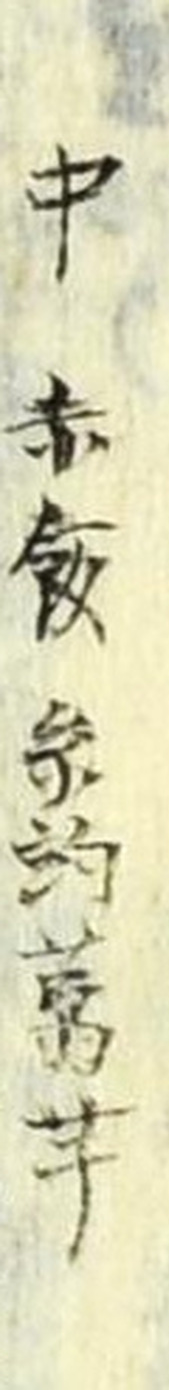中赤飯糸蒟蒻芋
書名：（日記）
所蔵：福井県文書館 Fukui Prefectural Archives
